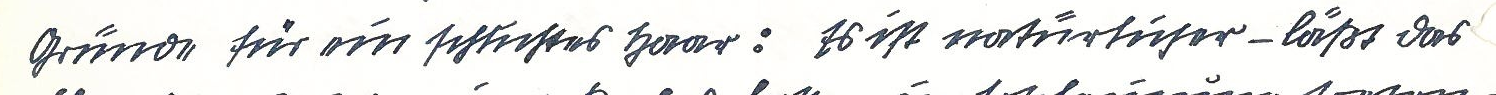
Gründe für ein schlichtes Haar: Es ist natürlicher – läßt das
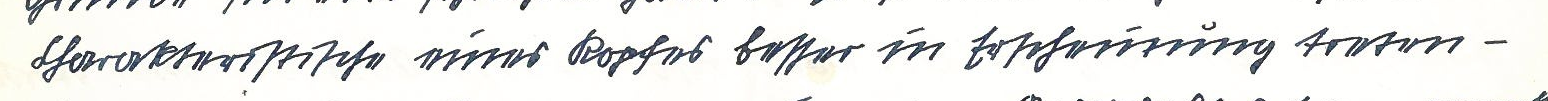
Charakteristische eines Kopfes besser in Erscheinung treten –
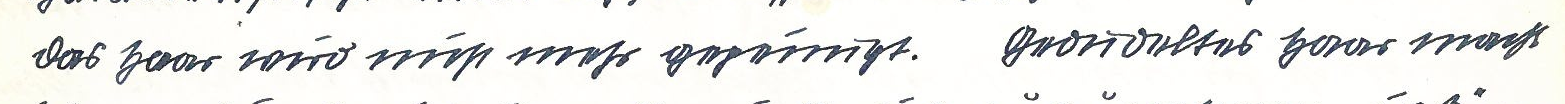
das Haar wird nicht mehr gepeinigt. Gedudeltes Haar macht
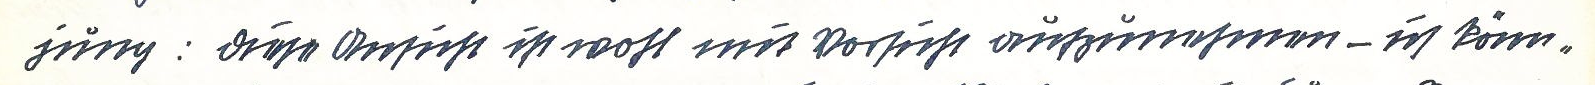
jung: diese Ansicht ist wohl mit Vorsicht aufzunehmen – ich könn¬
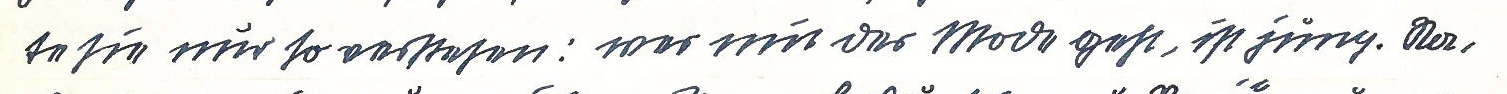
te sie nur so verstehen: wer mit der Mode geht, ist jung. Na,
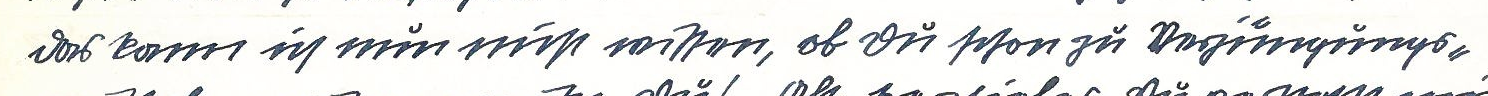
das kann ich nun nicht wissen, ob Du schon zu Verjüngungs¬
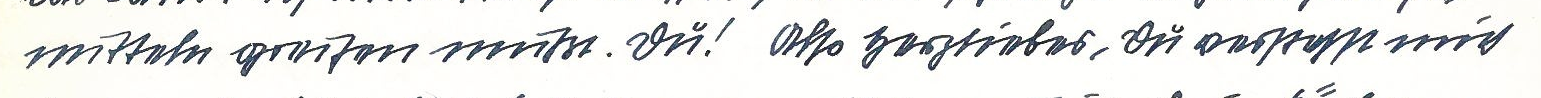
mitteln greifen mußt. Du! Also Herzliebes, Du verstehst mich
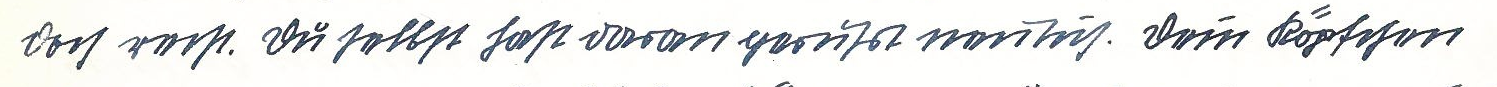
doch recht. Du selbst hast daran gerührt neulich. Dein Köpfchen
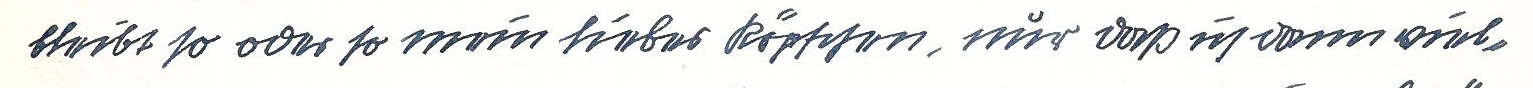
bleibt so oder so mein liebes Köpfchen, nur daß ich dann viel¬
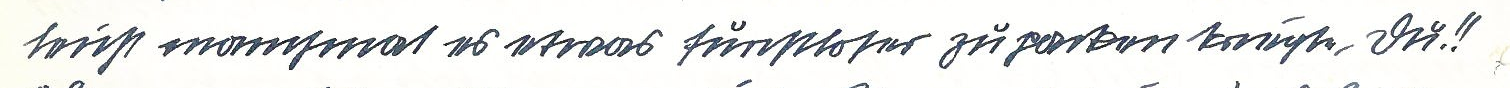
leicht manchmal es etwas furchtloser zu packen kriegte, Du!!
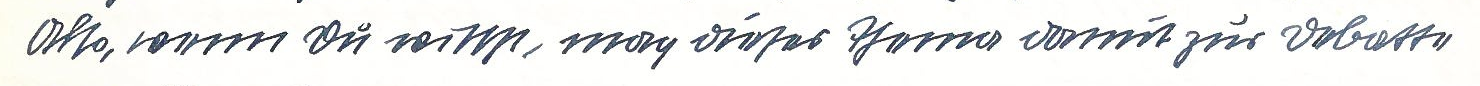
Also, wenn Du willst, mag dieses Thema damit zur Debatte
